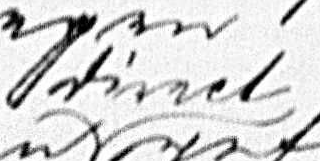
direct
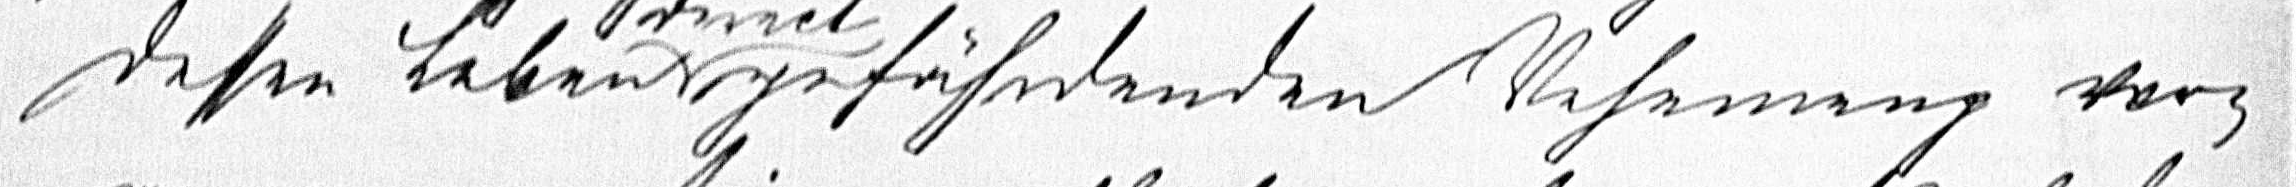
dessen Leben gefährdenden Vehemenz vor¬
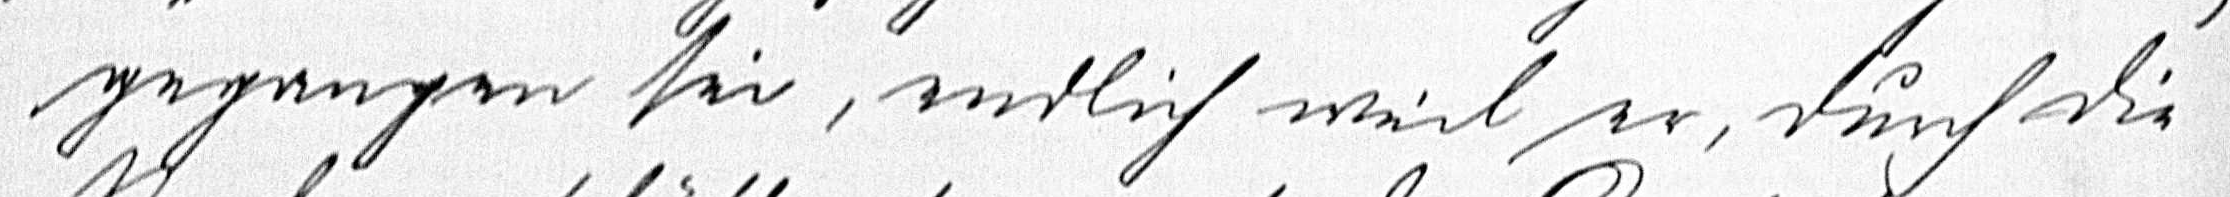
gegangen sei, endlich weil er, durch die
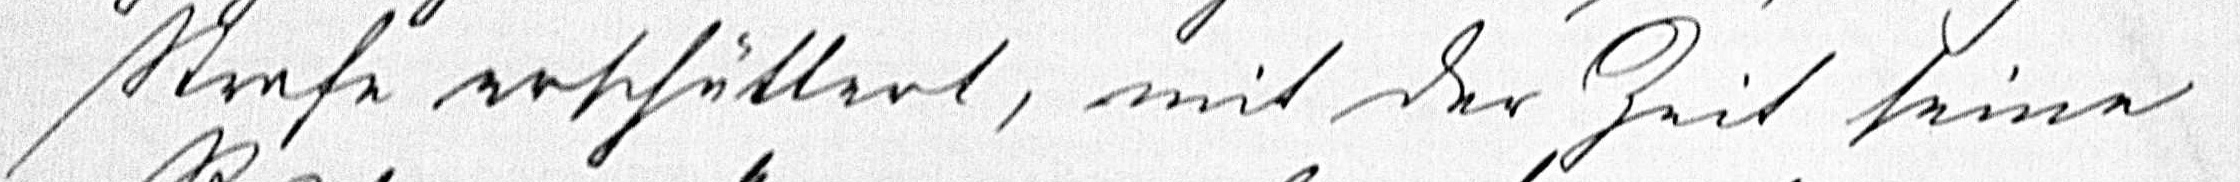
Strafe erschüttert, mit der Zeit seine
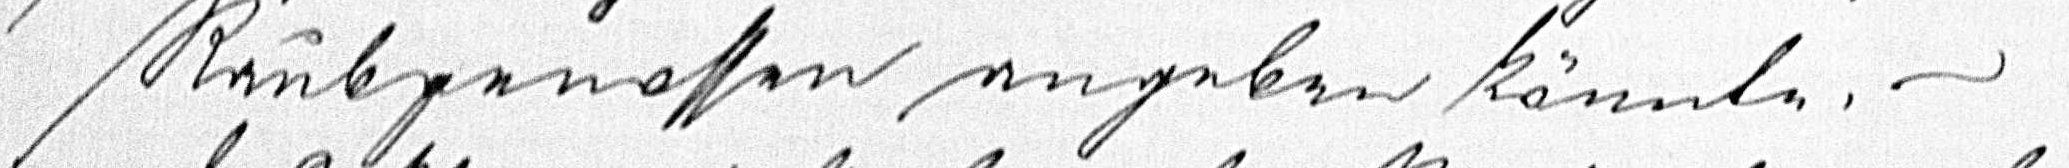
Raubgenossen angeben könnte.
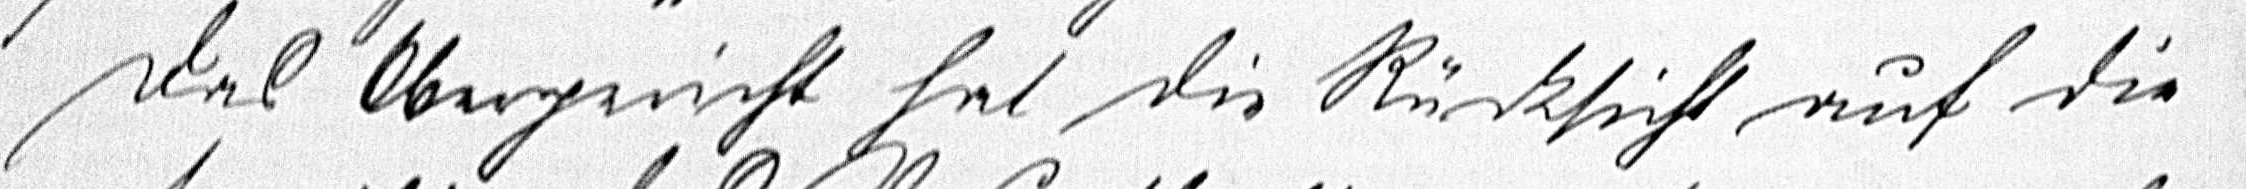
Das Obergericht hat die Rücksicht auf die
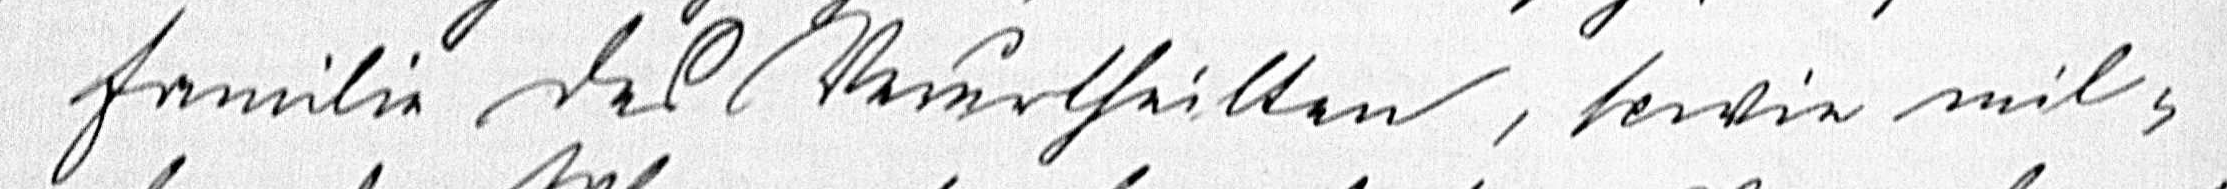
Familie des Verurtheilten, sowie mil¬
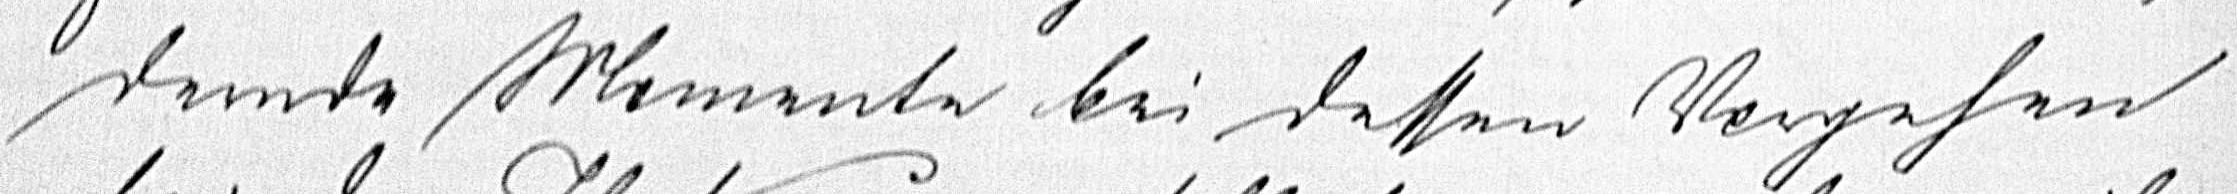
dernde Momente bei dessen Vorgehen
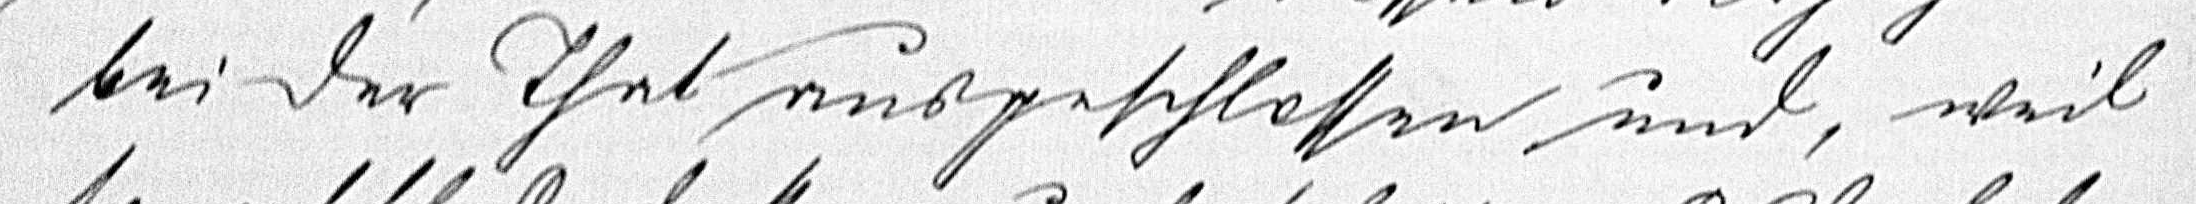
bei der That ausgeschlossen und, weil
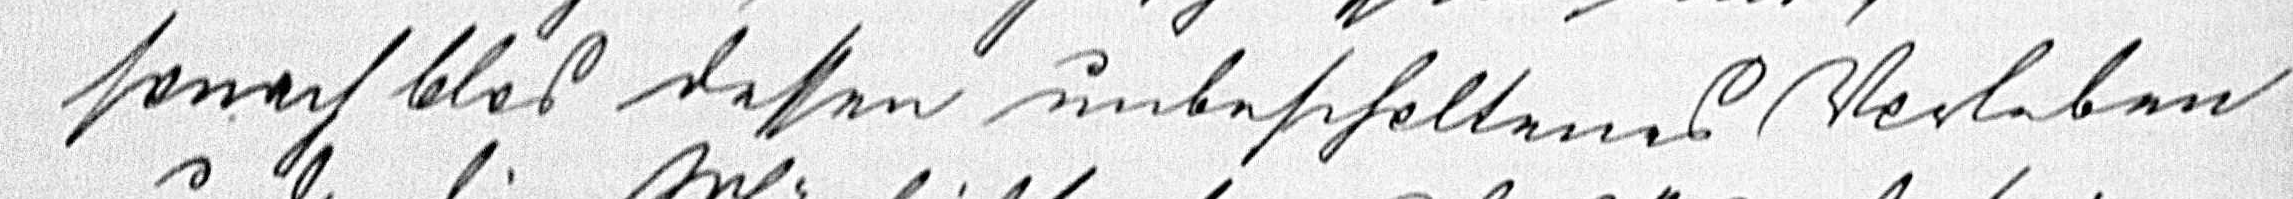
sonach blos dessen unbescholtenes Vorleben
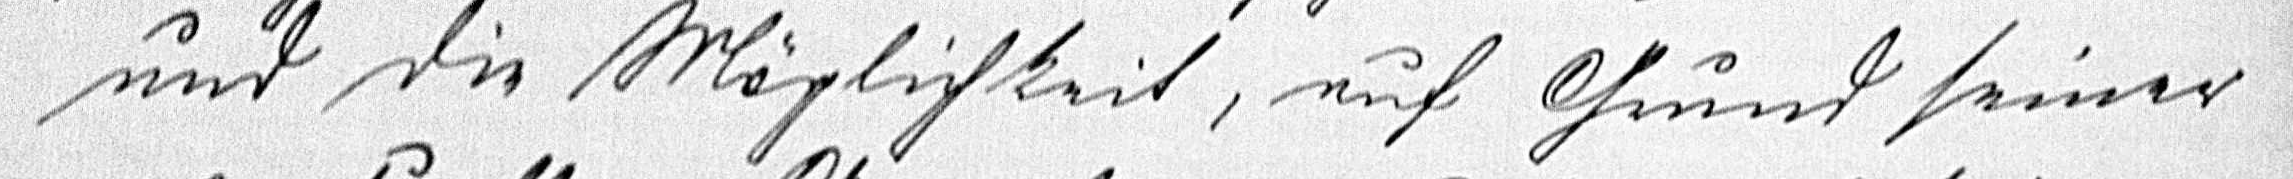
und die Möglichkeit, auf Grund seiner
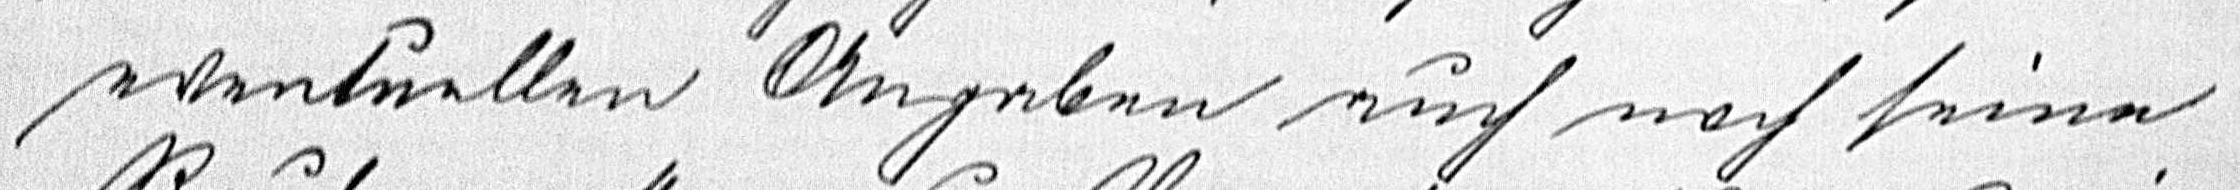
eventuellen Angaben auch noch seine
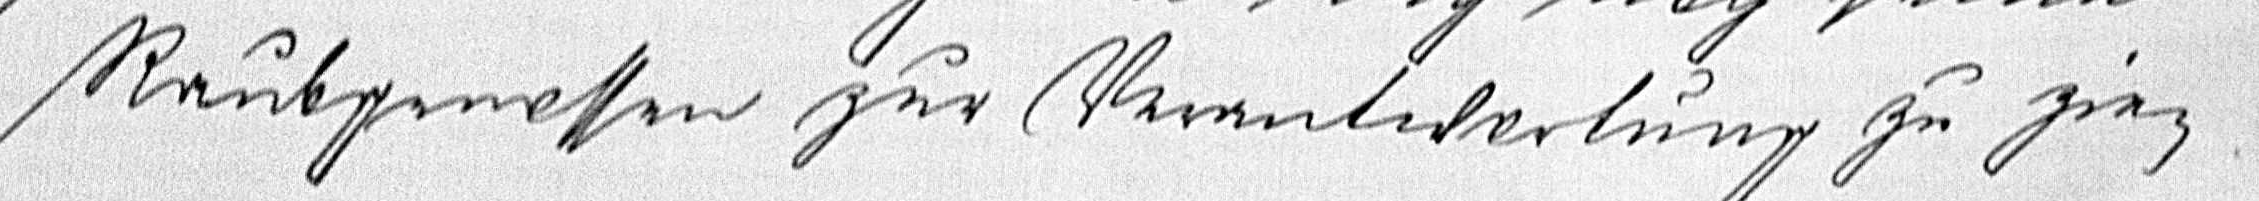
Raubgenossen zur Verantwortung zu zie¬
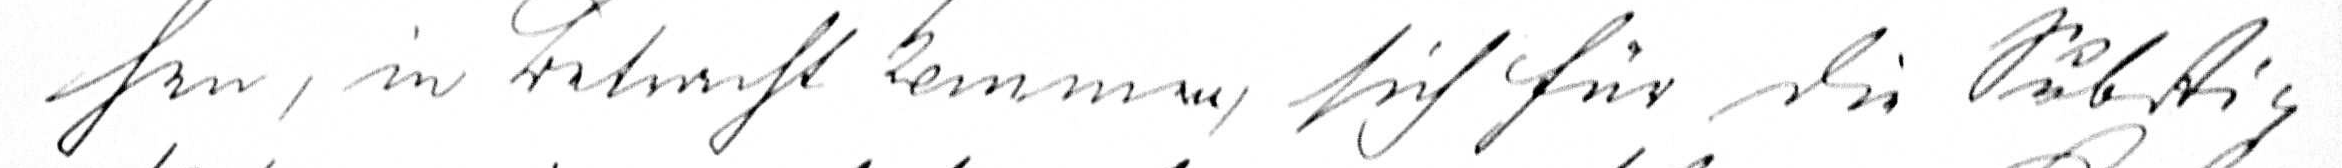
henk in Betracht kommen, sich für die Substi¬
